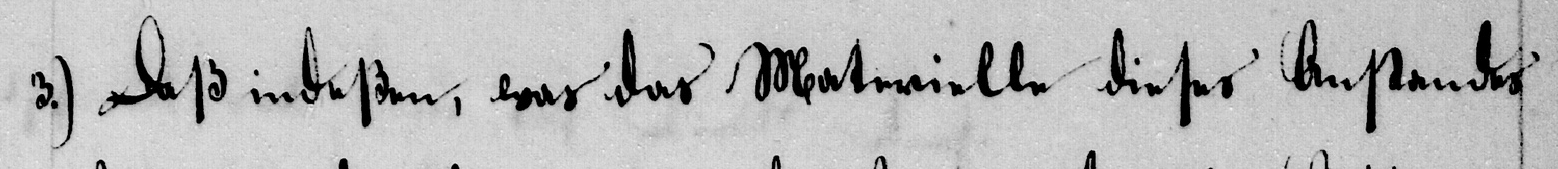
3.) Daß indeßen, was das Materielle dieses Anstandes
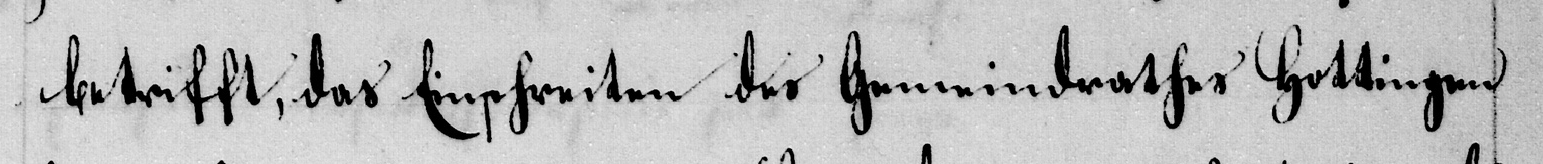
betrifft, das Einschreiten des Gemeindrathes Hottingen
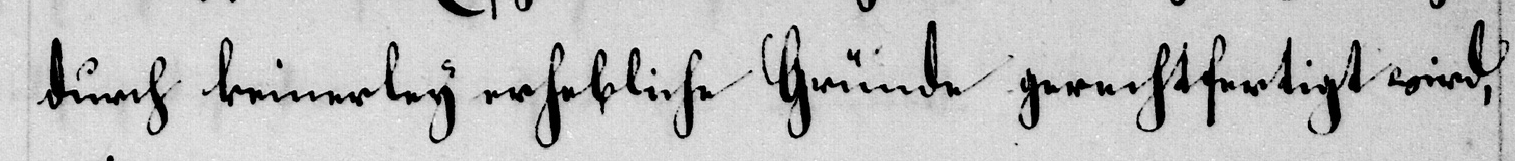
durch keinerley erhebliche Gründe gerechtfertigt wird,
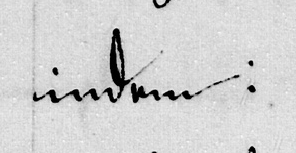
indem:
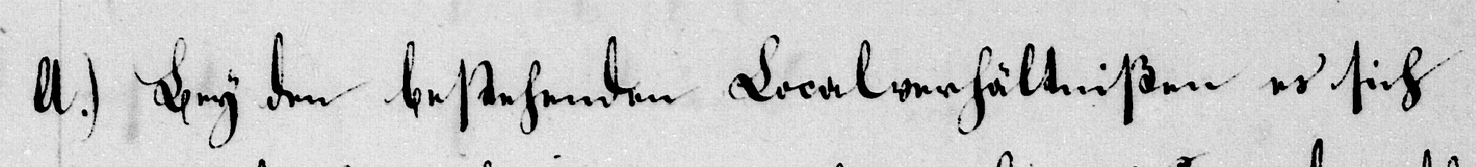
A.) Bey den bestehenden Localverhältnißen es sich
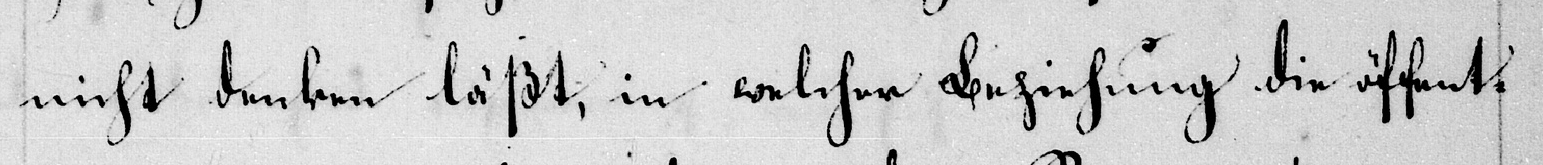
nicht denken läßt, in welcher Beziehung die öffent¬
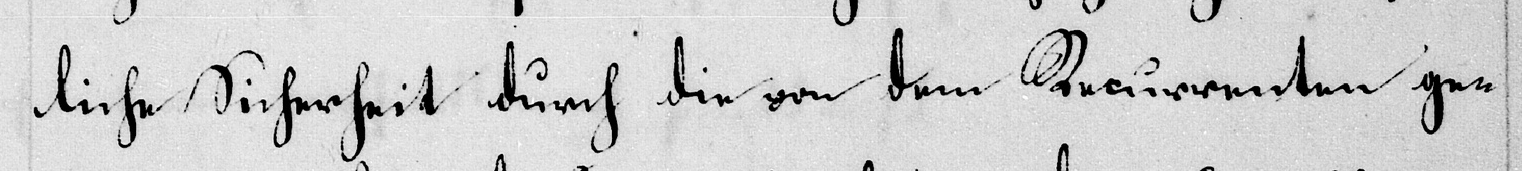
liche Sicherheit durch die von dem Recurrenten ge¬
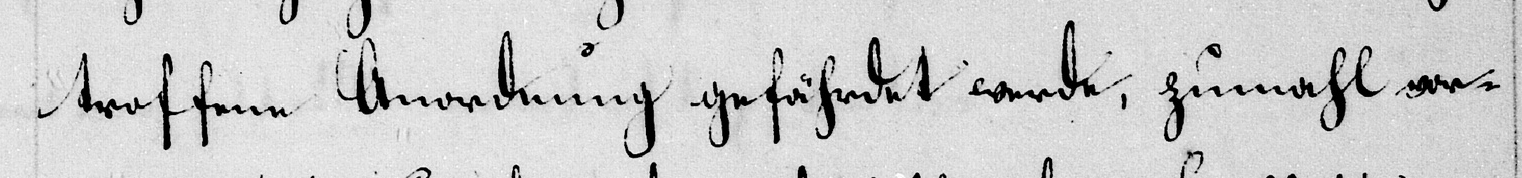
troffene Anordnung gefährdet werde, zumahl vor¬
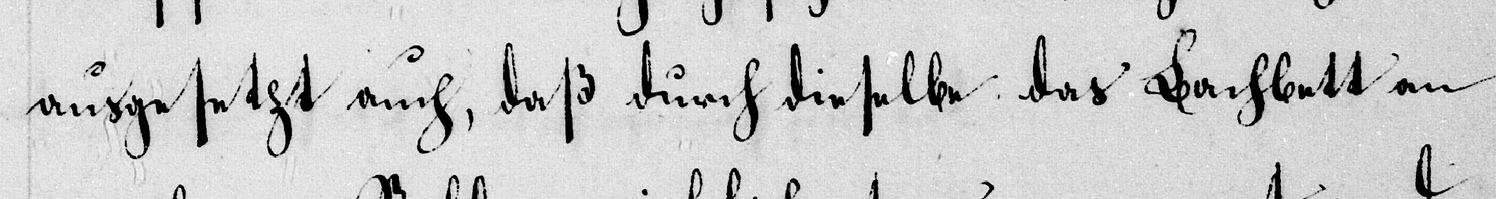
ausgesetzt auch, daß durch dieselbe das Bachbett an
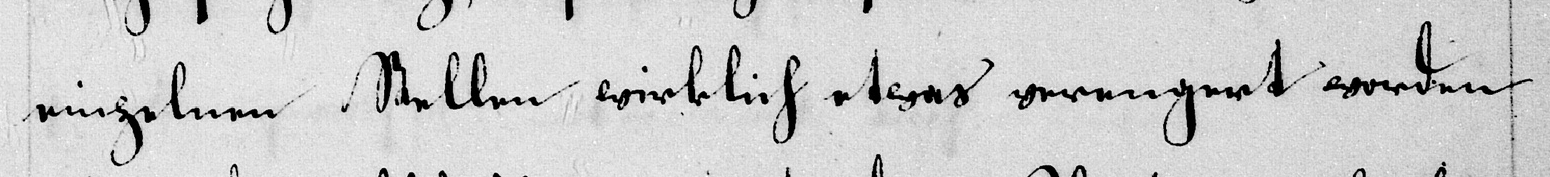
einzelnen Stellen wirklich etwas verengert worden
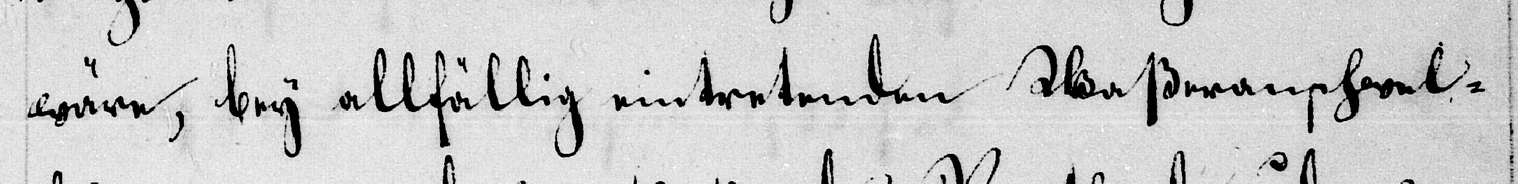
wäre, bey allfällig eintretenden Waßeranschwel¬
